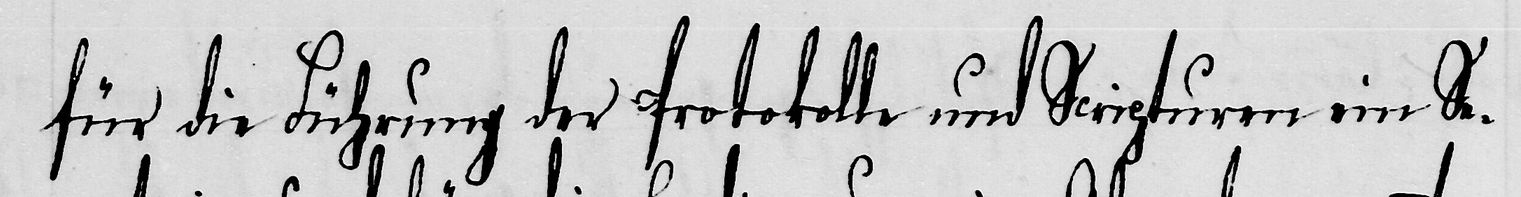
für die Führung der Protokolle und Scripturen ein
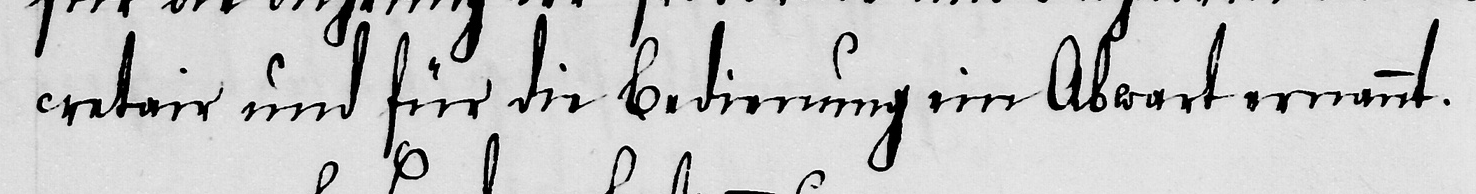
cretair und für die Bedienung ein Abwart ernannt.
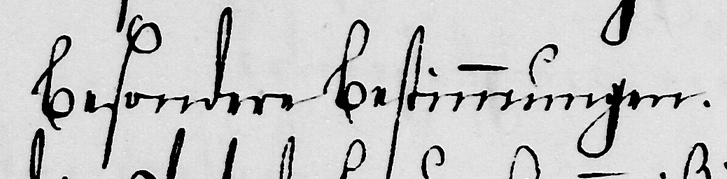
Besondere Bestimmungen.
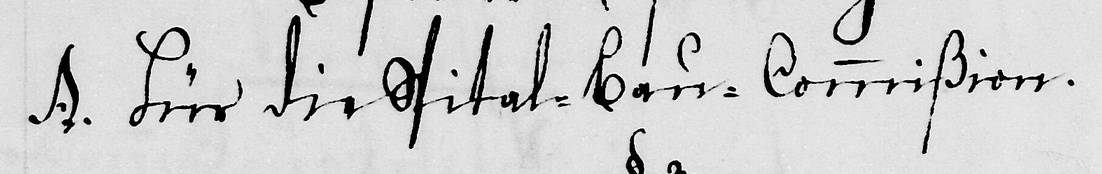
A. Für die Spital-Bau-Commißion.
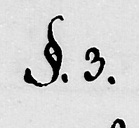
§.3.
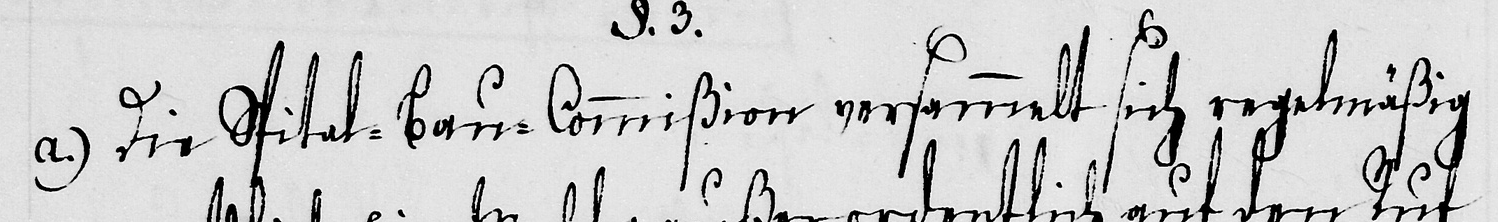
a.) Die Spital-Bau-Commißion versammelt sich regelmäßig
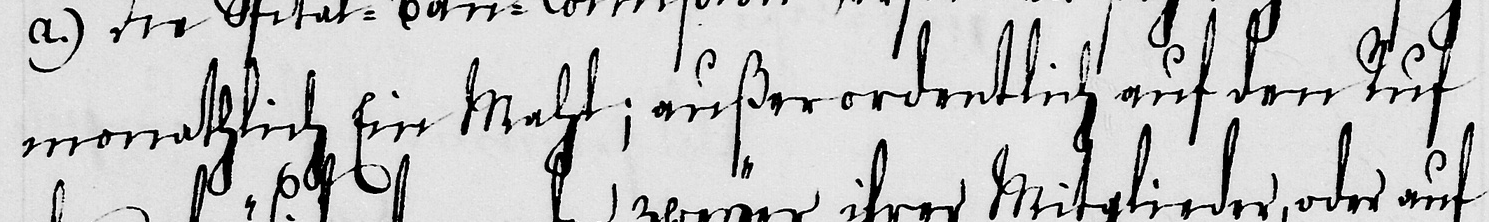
monathlich Ein Mahl; außerordentlich auf den Ruf
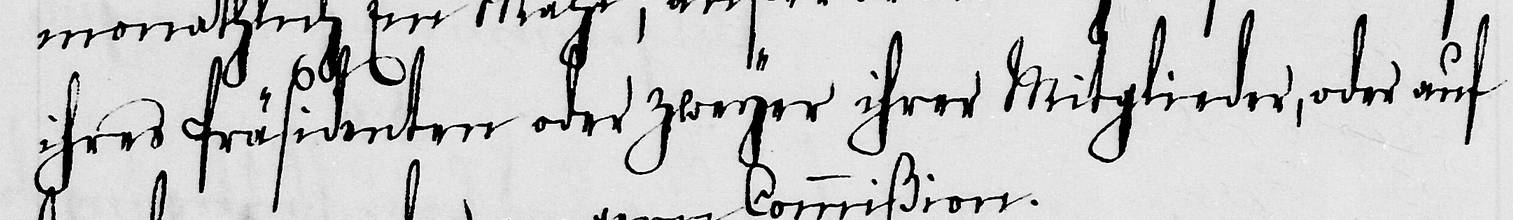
ihres Präsidenten oder zweyer ihrer Mitglieder, oder auf
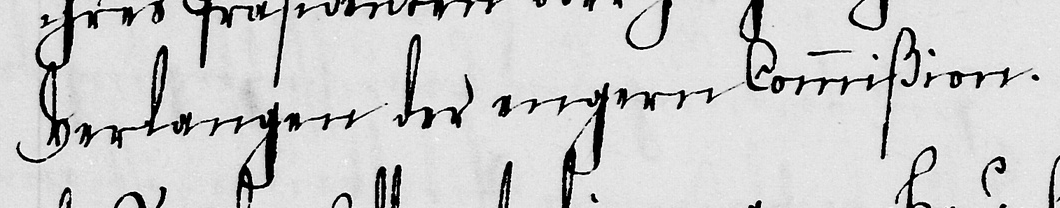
Verlangen der engern Commißion.
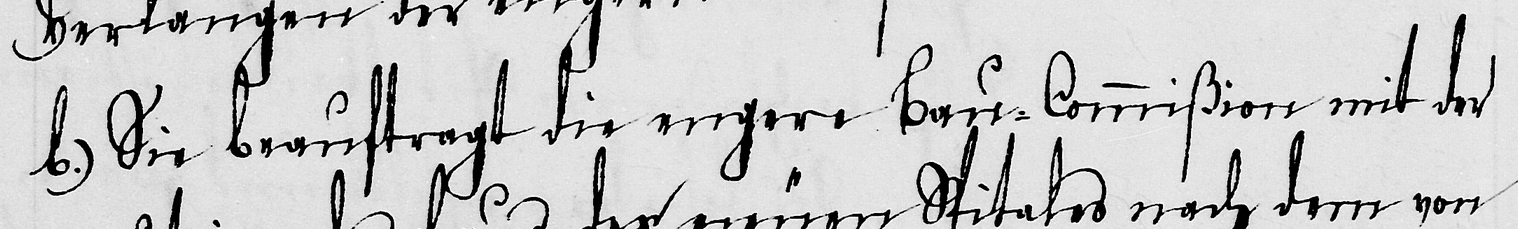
b.) Sie beauftragt die engere Bau-Commißion mit der
